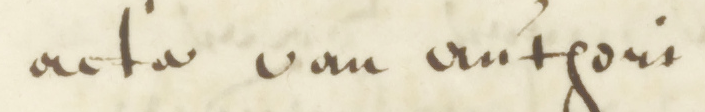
acte van authori„
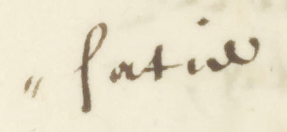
satie
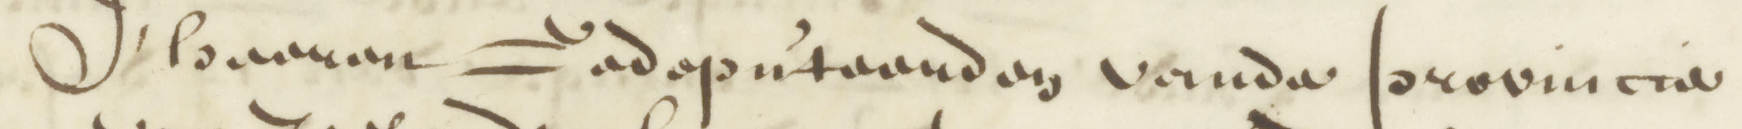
D'Heeren Gedeputeerden vande provincie
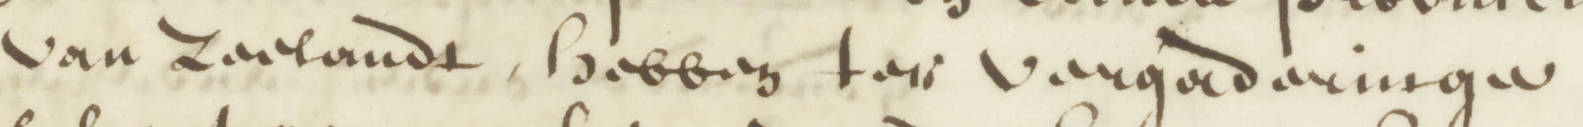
van Zeelandt, hebben ter vergaderinge
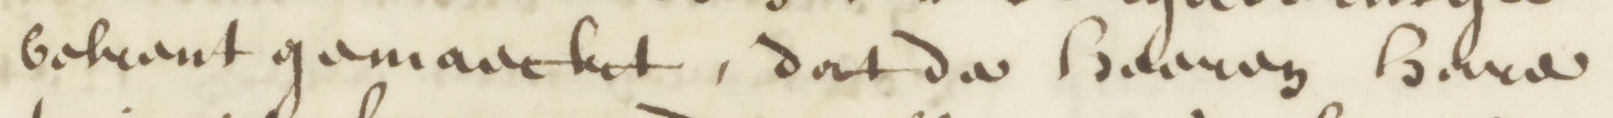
bekent gemaeckt, dat de heeren hare
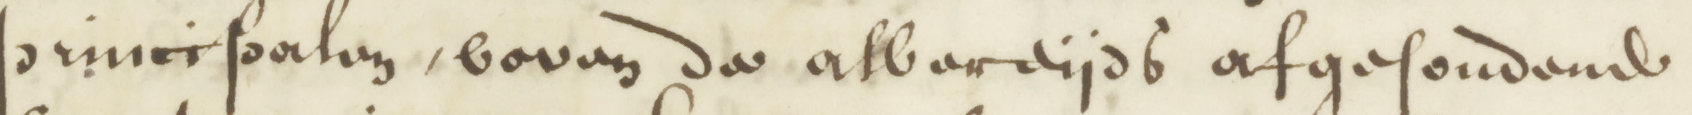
principalen, boven de albereijds afgesondene
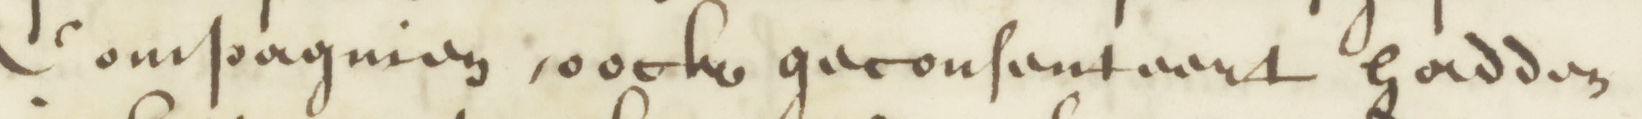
Compagnien, oock geconsenteert hadden,
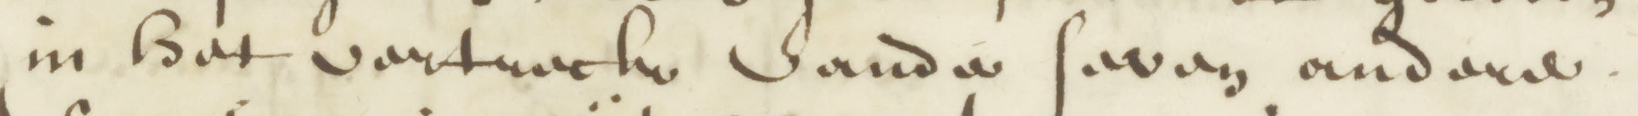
in het vertreck vande seven andere
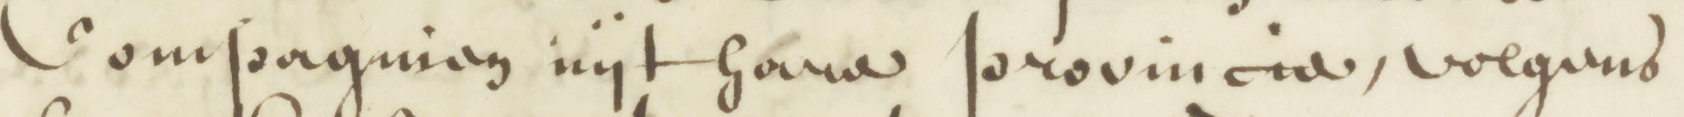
Compagnien uijt hare provincie, volgens
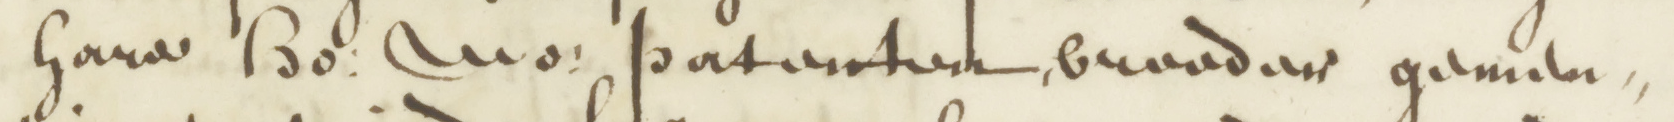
hare Ho:Mo: patenten, breeder gemen„
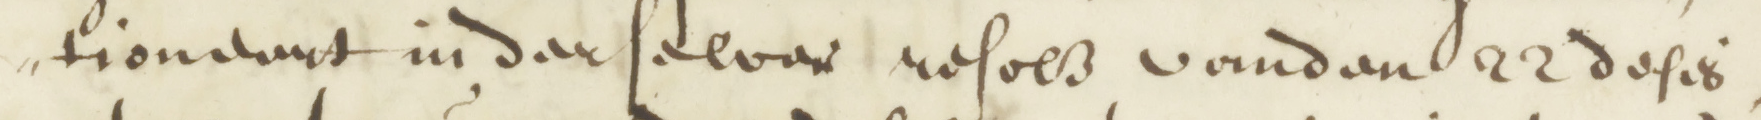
,,tioneert in der selver resol vanden 22 deses,
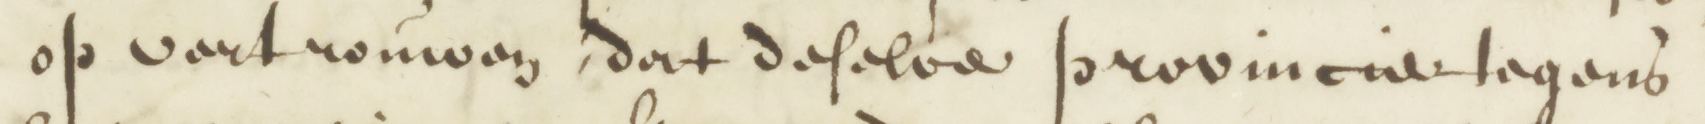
op vertrouwen, dat deselve provincie tegens
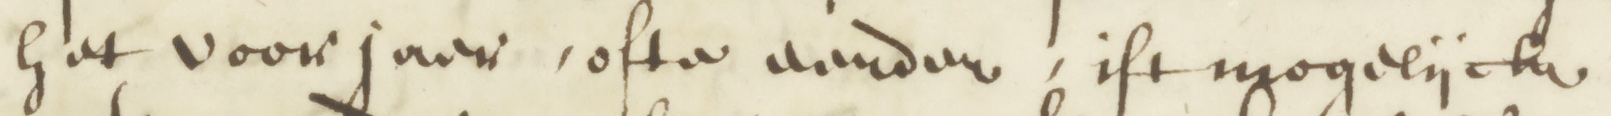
het voor jaer, ofte eerder, ist mogelijck
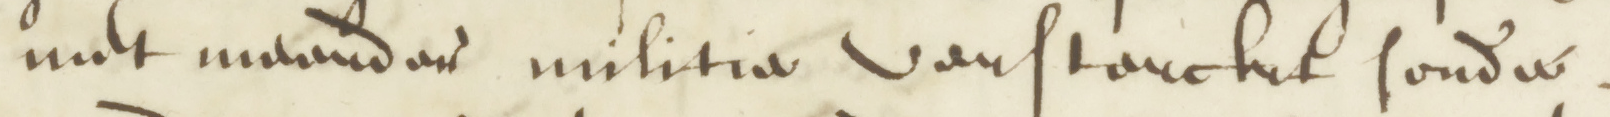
met meerder militie versterckt soude
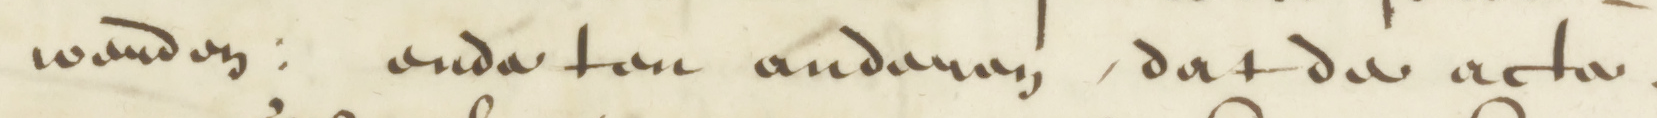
werden: ende ten anderen, dat de acte
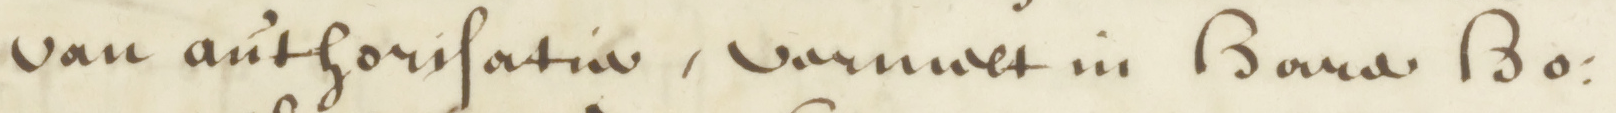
van authorisatie, vermelt in hare Ho:
